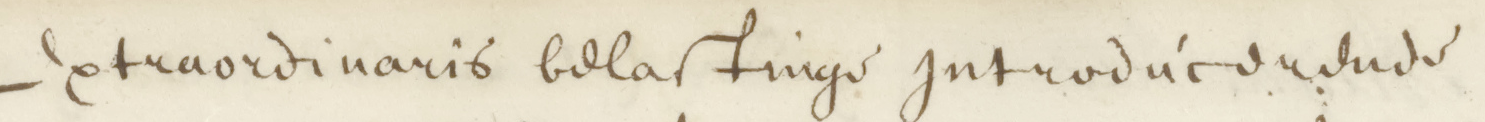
extraordinaris belastinge introducerende
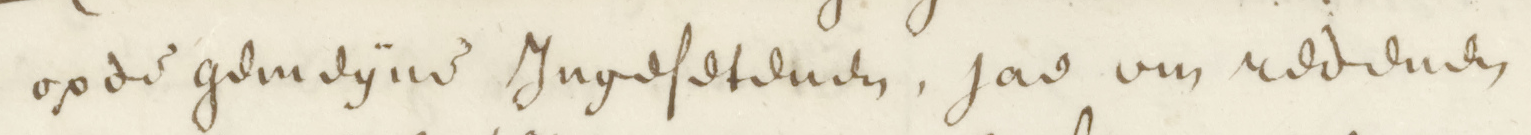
opde gemeijne Ingesetenen, jae om redenen
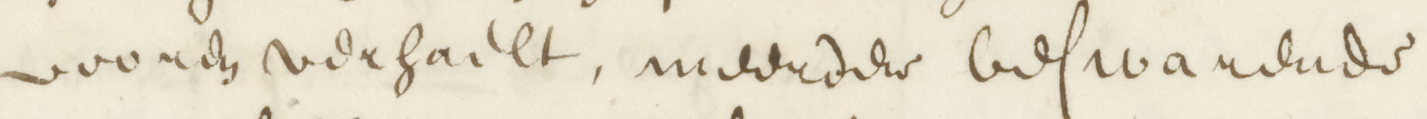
vooren verhaelt, meerder beswarende
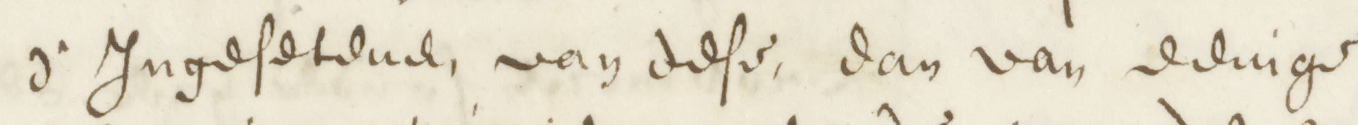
d'ingesetenen van dese, dan van eenige
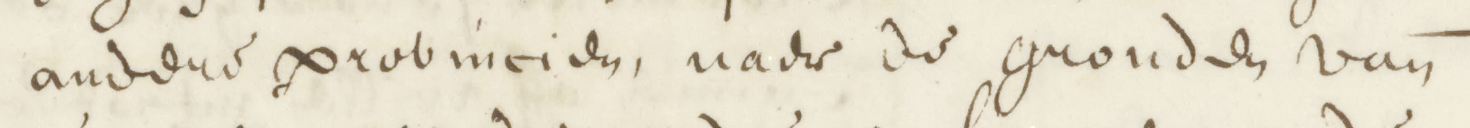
andere provincien, naer de gronden van
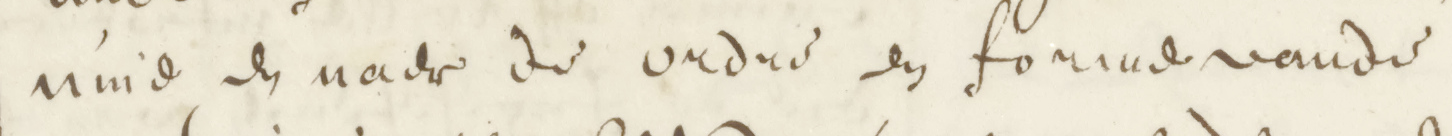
Unie en naer de ordre en forme vande
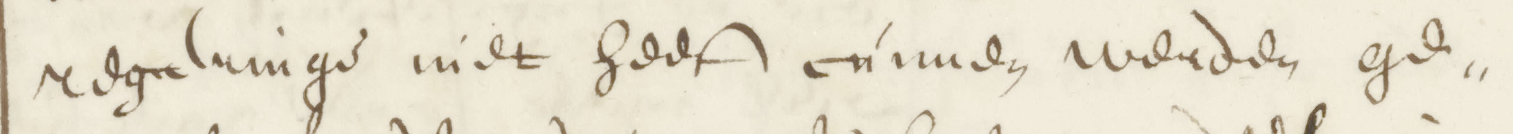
regeringe niet heeft cunnen werden ge„
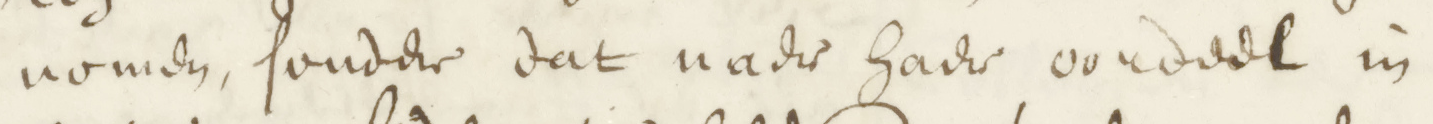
nomen, sonder dat naer haer oordeel in
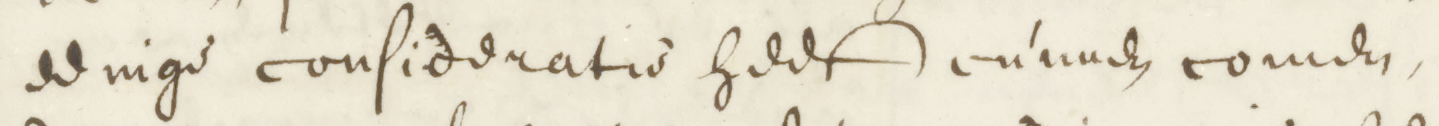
eenige consideratie heeft cunnen comen,
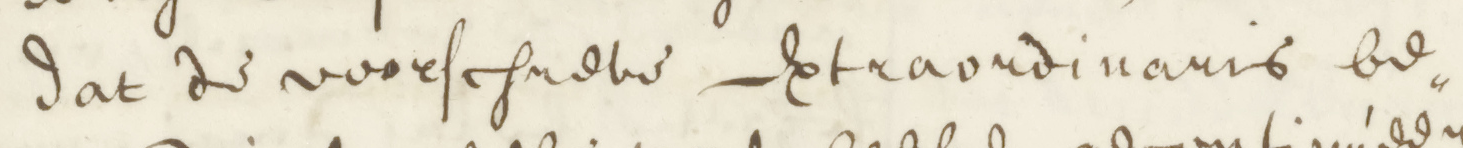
dat de voorschreve extraordinaris be„
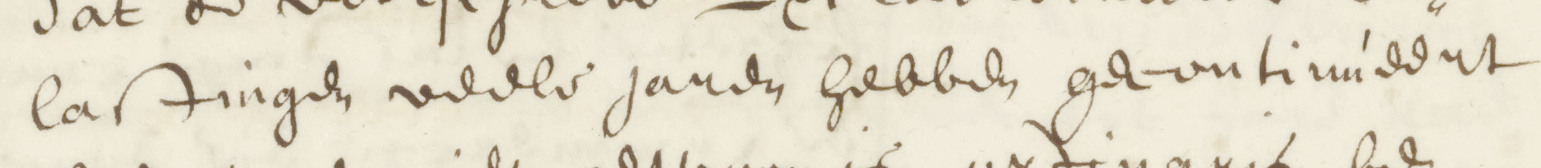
lastingen veele jaren hebben gecontinueert
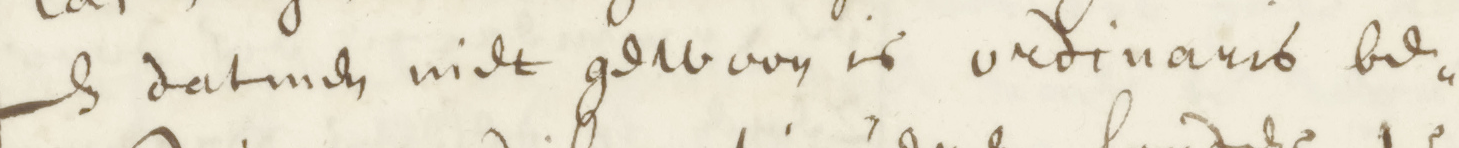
en datmen niet gewoon is ordinaris be„
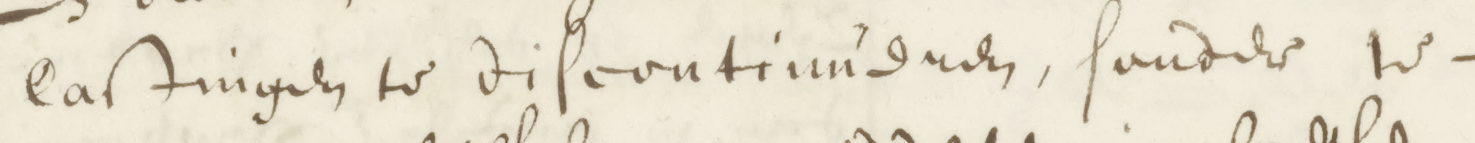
lastingen te discontinueren, sonder te
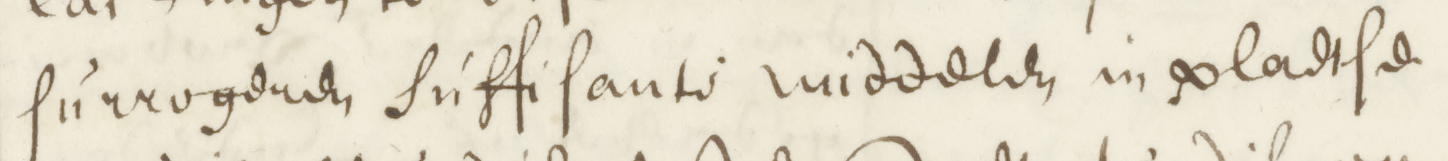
surrogeren suffisante middelen in plaetse
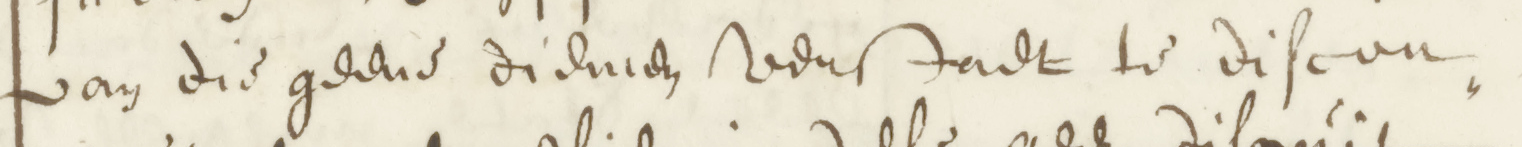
van die geene diemen verstaet te discon,,
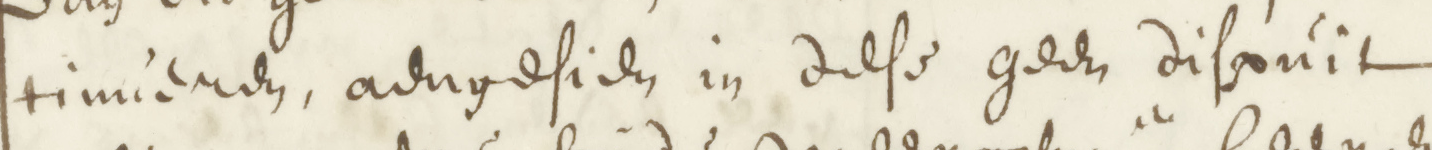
tinueren, aengesien in dese geen dispuit
